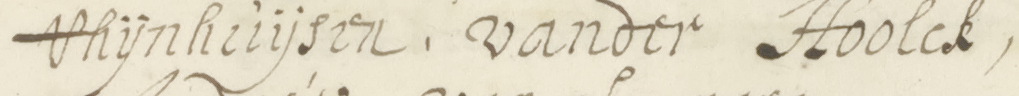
Rhijnhuiijsen, vander Hoolck,
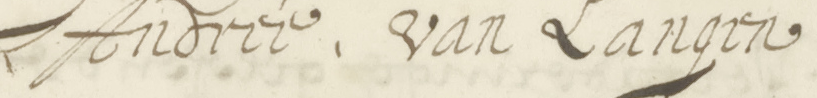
Andreé, van Langen.
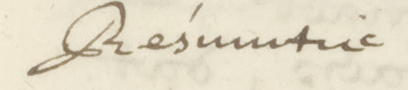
Resumtie
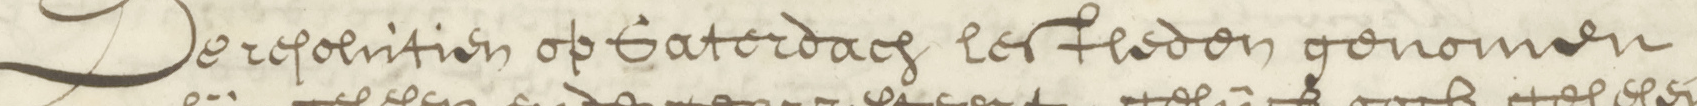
De resolutien op Saterdach lestleden genomen,
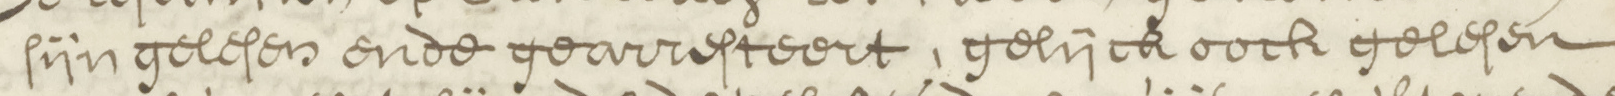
sijn gelesen ende gearresteert, gelijck oock gelesen
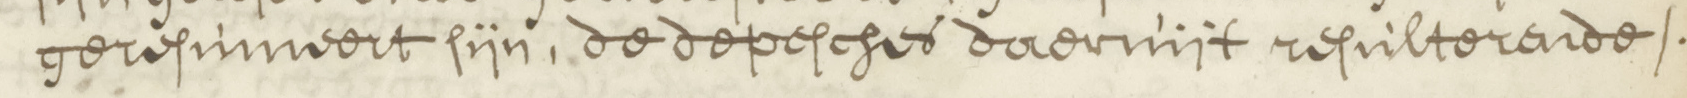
geresumeert sijn, de depesches daeruijt resulterende.
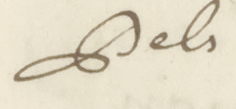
Pels
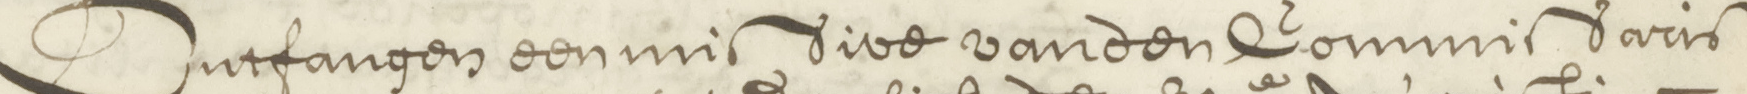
Ontfangen een missive vanden Commissaris
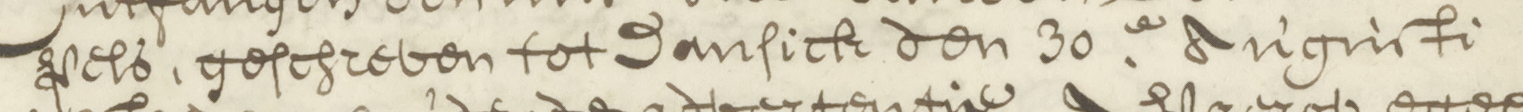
Pels, geschreven tot Dansick den 30e. Augusti
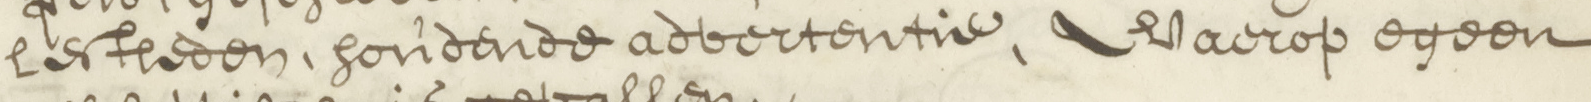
lestleden, houdende advertentie. Waerop egeen
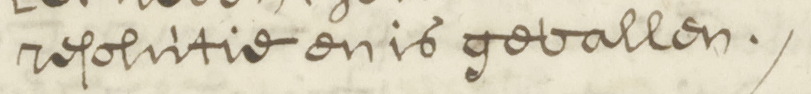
resolutie en is gevallen.
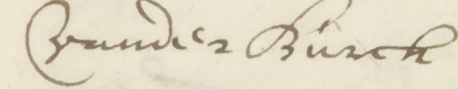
vander Burch
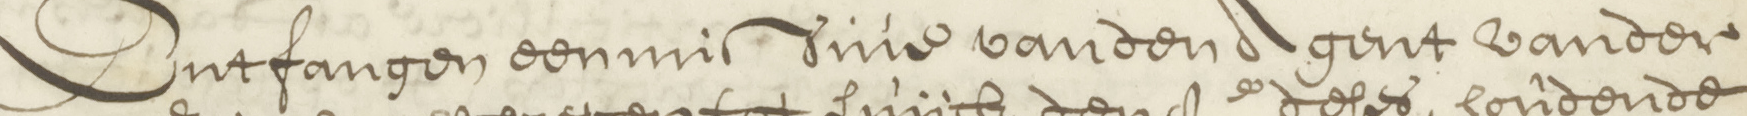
Ontfangen een missiue van den Agent vander
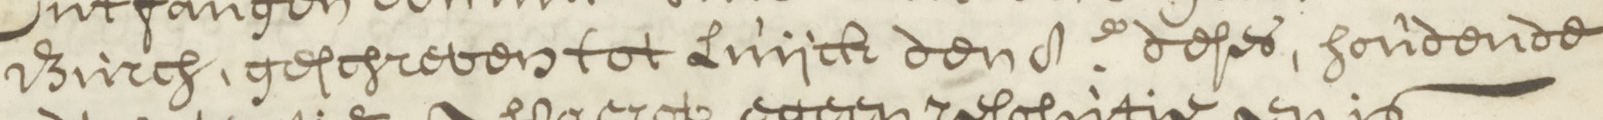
Burch, geschreven tot Luijck den 8e. deses, houdende
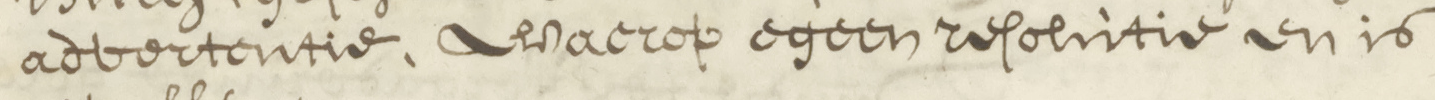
advertentie. Waerop egeen resolutie en is
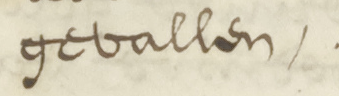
gevallen.
